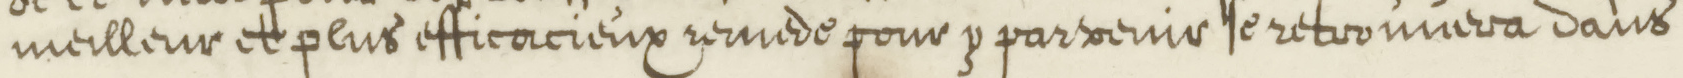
meilleur et plus efficacieux remede pour y parvenir se retrouuera dans
